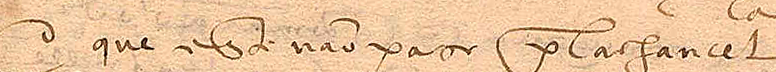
e que este naõ pase p̄la chanceLra
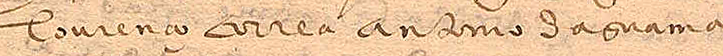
lourenço correa antonio da guama
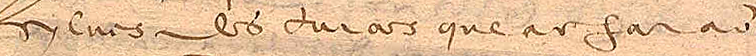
sylues dos turcos que acharaõ
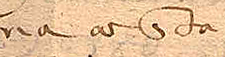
na costa
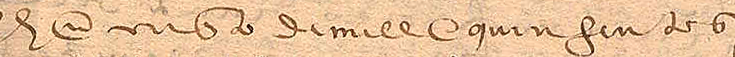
Jhū cristo de mill e quinhentos
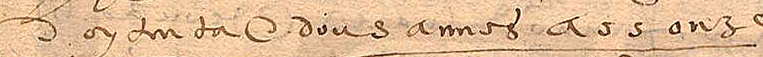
e oytenta e dous annos aos onze
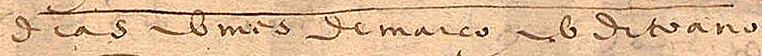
dias do mes de março do dito ano
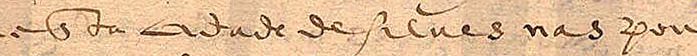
nesta cidade de silues nas pou
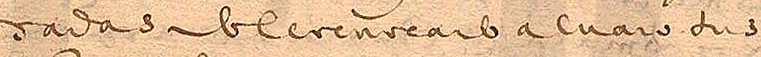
sadas do lecenceado aluaro tris
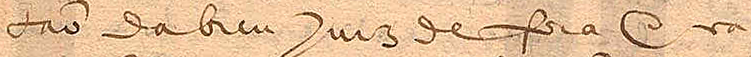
taõ dabreu Juiz de fora e ca
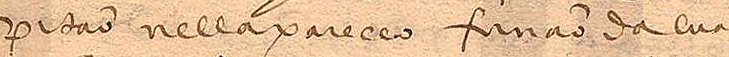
pitaõ nella pareceo fernaõ dalua
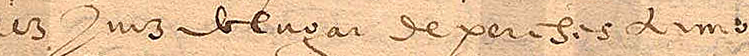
rez Juiz do lugar de perches termo
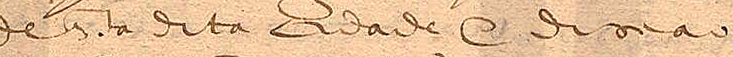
desta dita cidade e dise ao
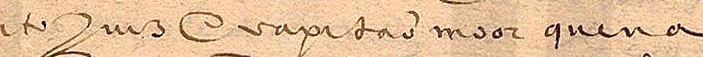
dito Juiz e capitaõ moor que na
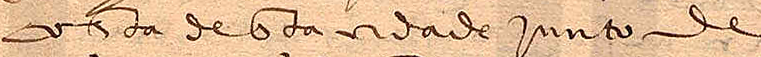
costa desta cidade junto de
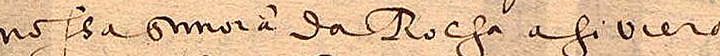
nossa snnorā da Rocha ahi viera
